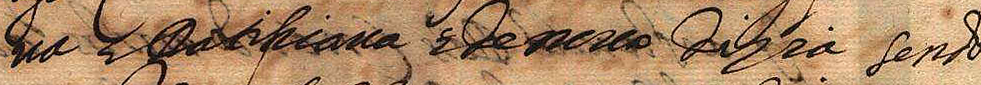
ua E Ratificaua E de nouo dizia sendo
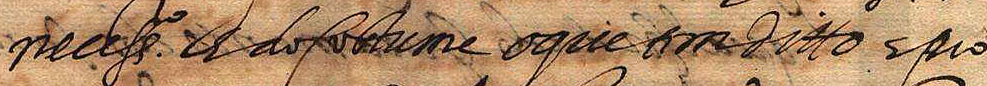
necess.ro E do Costume o que tem ditto E pro
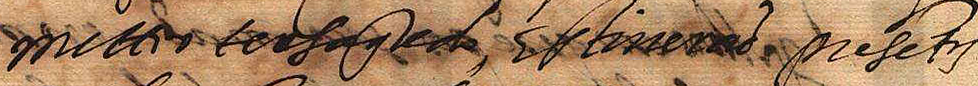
metteo ter segredo, Estiueraõ presētes
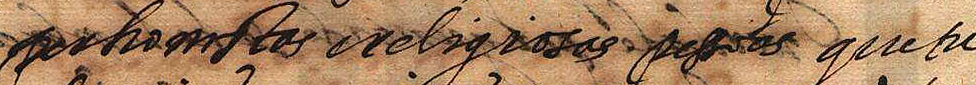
por honestas e religiosas pessoas que tu
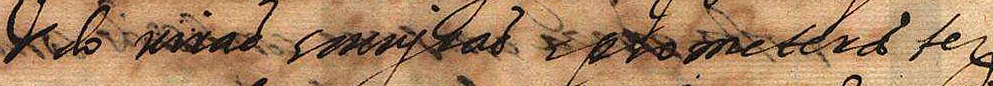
do uiraõ E ouujraõ E prometeraõ ter
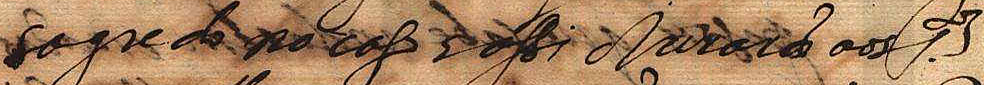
segredo no caso E assi o Iuraraõ aos s.tos
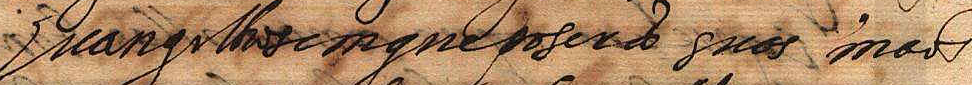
Euangelhos em que poseraõ suas maõs
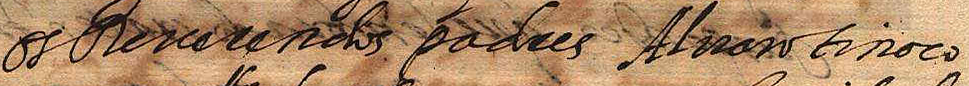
os Reuerendos padres Aluaro tinoco
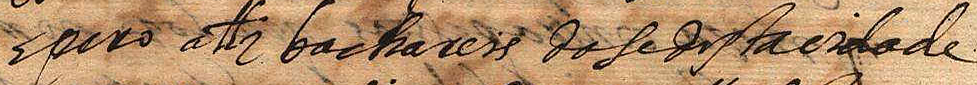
E pero all̄z bachareis da se desta cidade
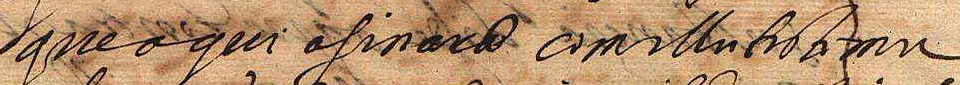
que aqui asinaraõ com ella testemu
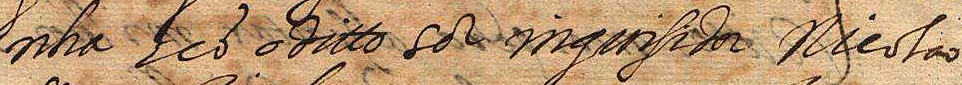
nha E cō o ditto sor inquisidor nicolao
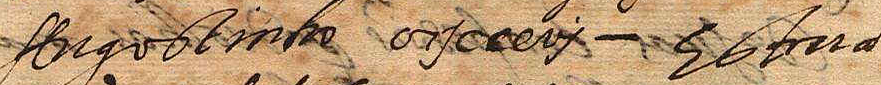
Augostinho o escrevj - Esteuā
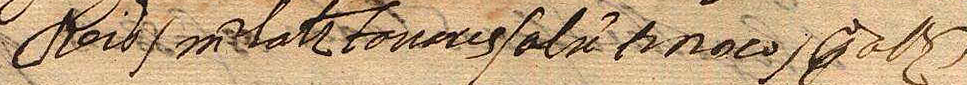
Rois̄ / mel al̄z tauares / alū tinoco / po allz̄
